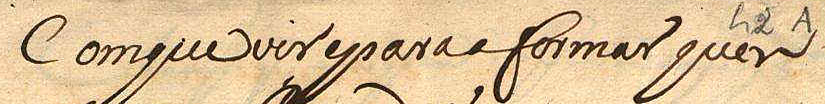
Com que vir e para a formar quer
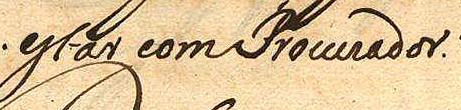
estar com Procurador?
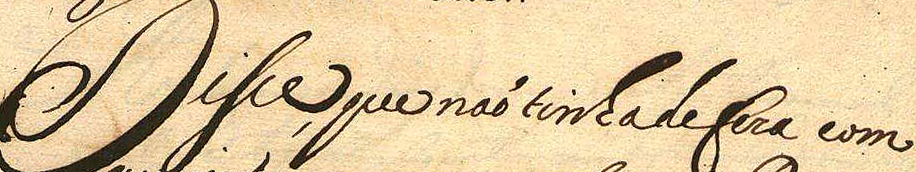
Disse que naõ tinha defeza com
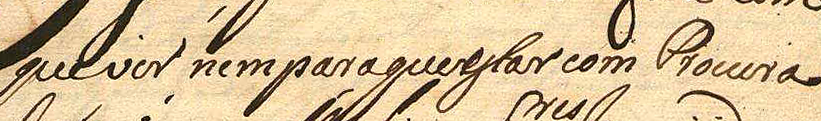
que vir, nem para que estar com Procura
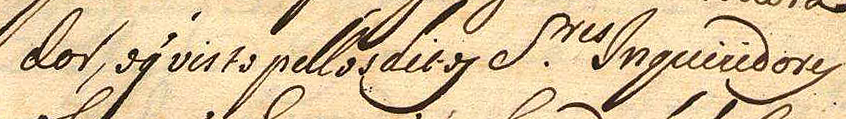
dor, o q̄ visto pellos ditos S.res Inquizidores
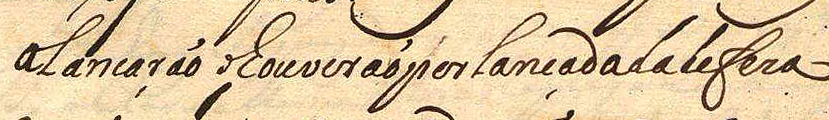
a Lançaraõ o houveraõ por Lançada da defeza
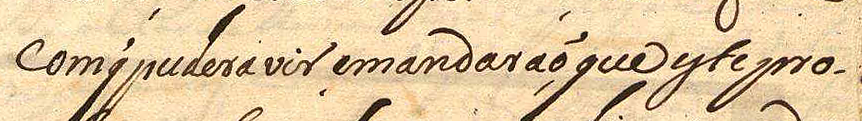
com q̄ pudera vir e mandaraõ, que este pro
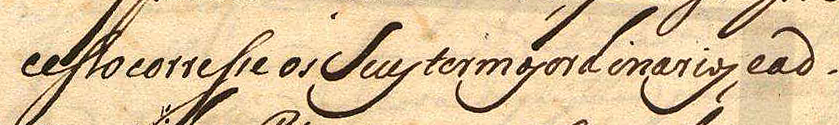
cesso corresse os Seus termos ordinarios, e ad.
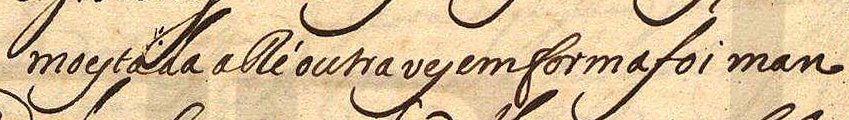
moestada a Ré outra ves em forma foi man
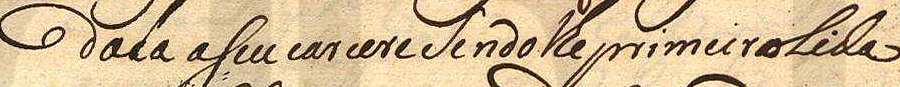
dada a seu carcere Sendo lhe primeiro Lida
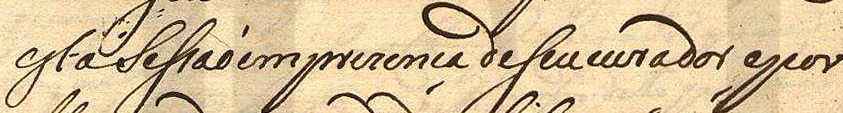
esta Sessaõ em prezença de seu curador, e por
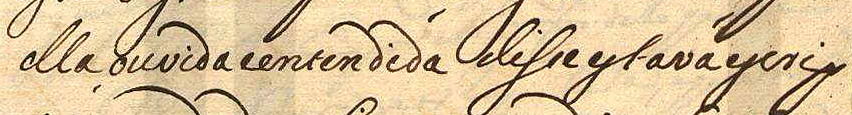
ella ouvida e entendida disse estava escrip
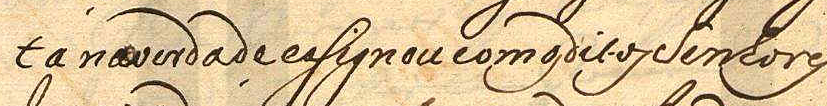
ta na verdade, e asignou com os ditos Senhores
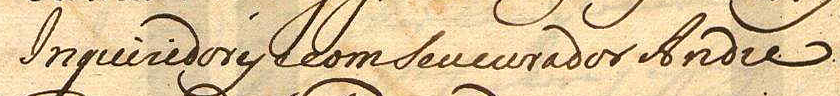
Inquizidores e com Seu curador Andre
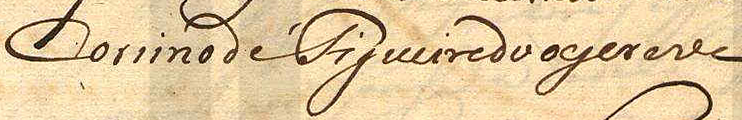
Corsino de Figueiredo o escrevi
